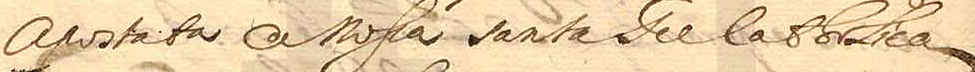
apostata de nossa santa Fee CathoLica
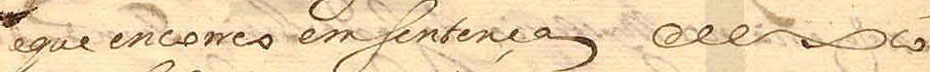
e que encorreo em sentença de exco
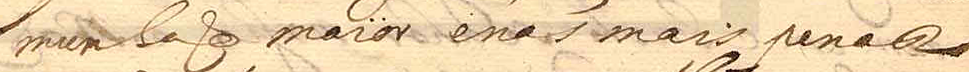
munhaõ maior e nas mais penas
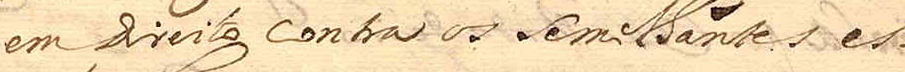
em Direito contra os semelhantes es
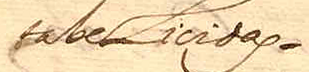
tabeLicidas.
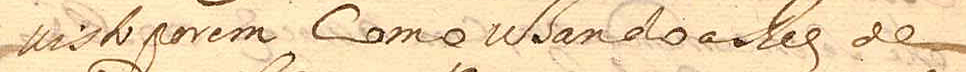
uisto porem como usando a Ree de
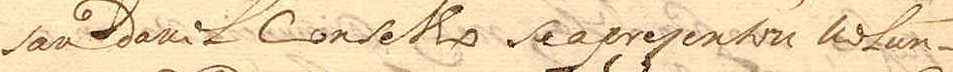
saudaueL conselho se aprezentou uolun
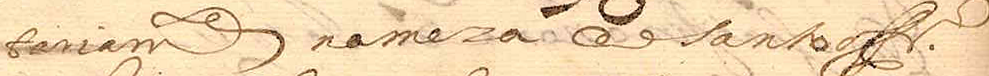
tariamte na meza do santo off.o
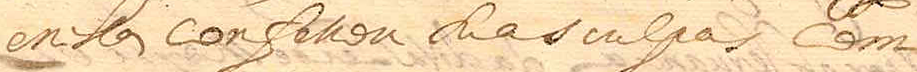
e nella confessou suas culpas com
